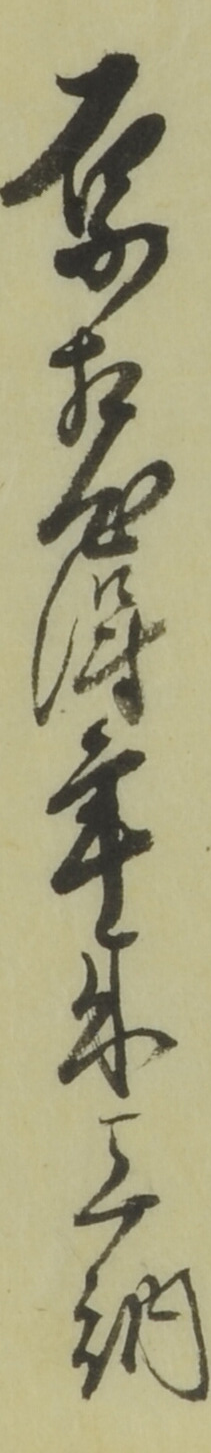厚相心得年来上納
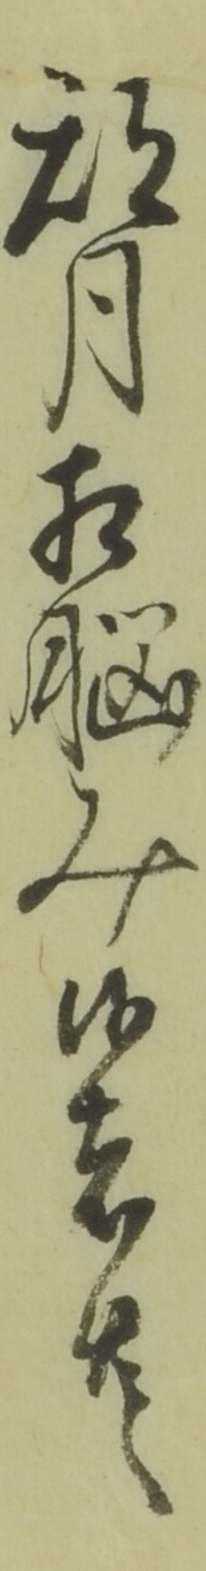期月相悩み候者共へ
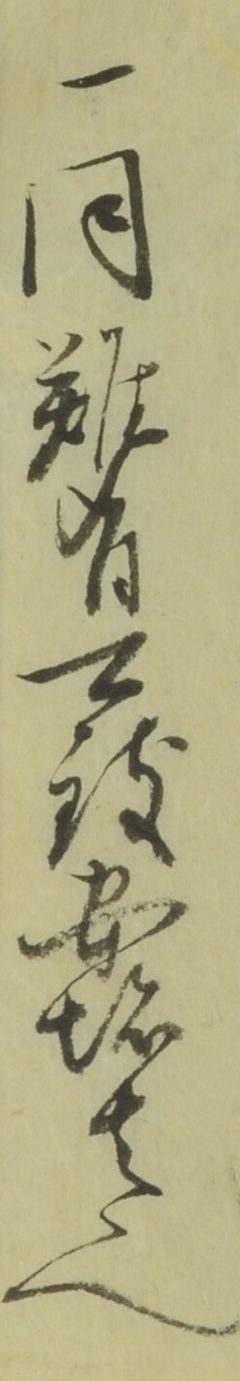一同難有可致安堵者也

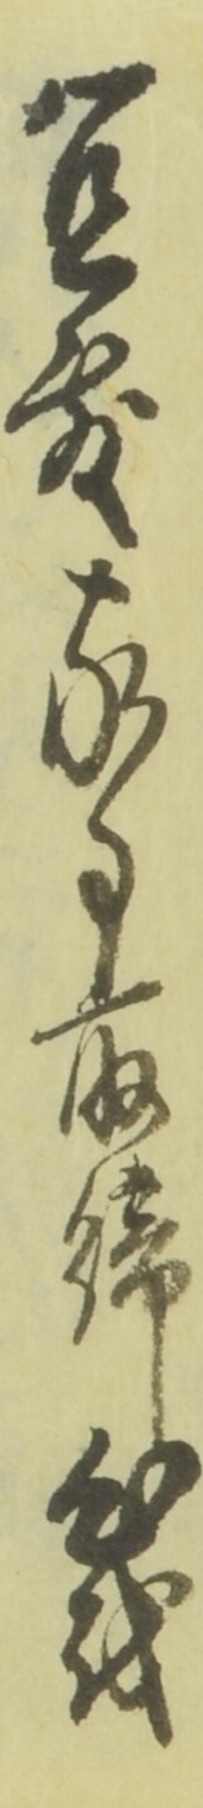宜敷家事取締心を
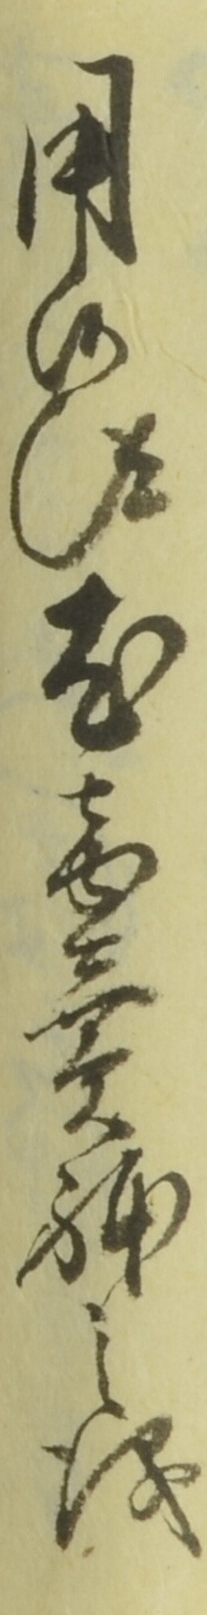用候趣尤商売体之儀
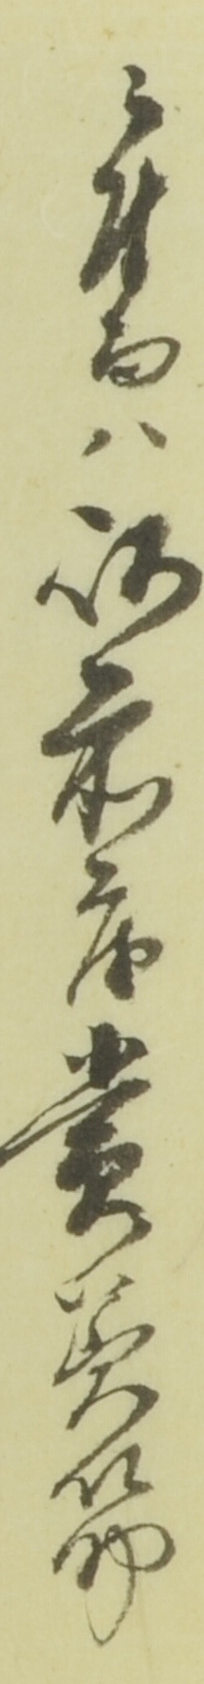ニ付而ハ以前も賞美筋
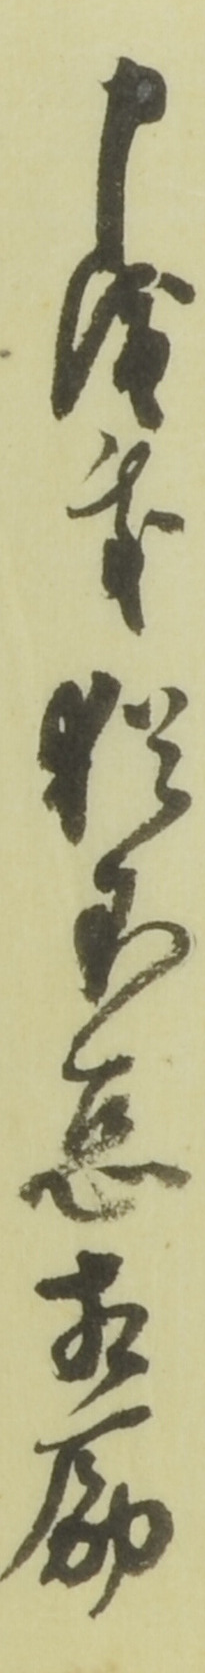申渡処猶不怠相励
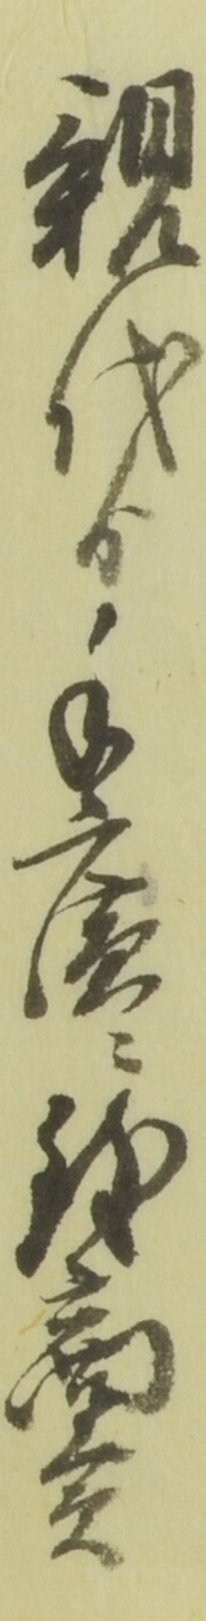親代ゟ手広ニ致商売
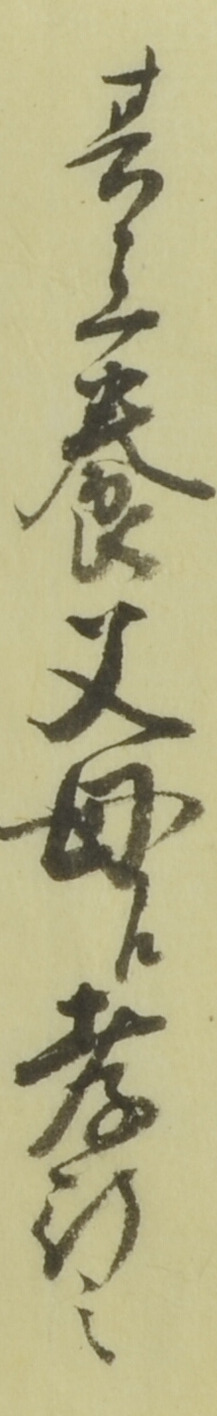其上養父母江孝行之
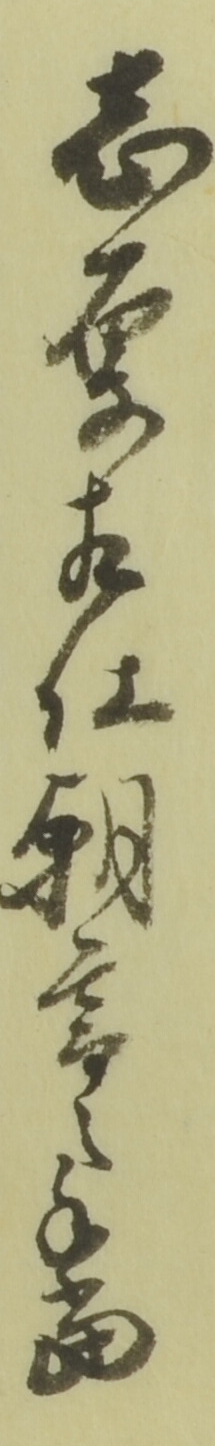志厚相仕朝暮之手当
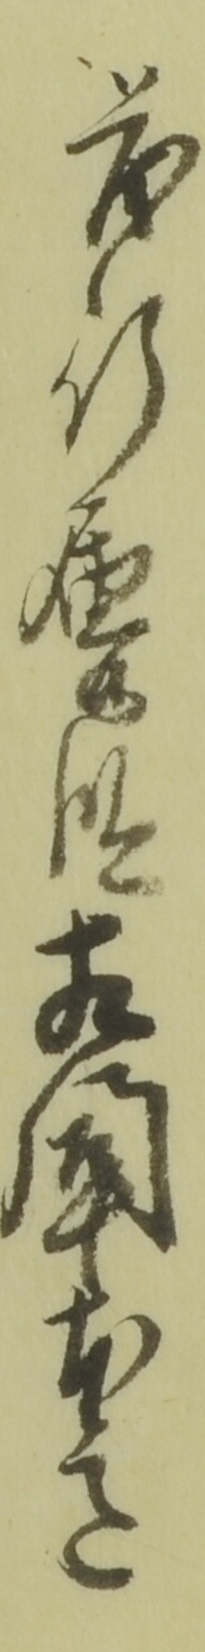も行届候段相聞本意
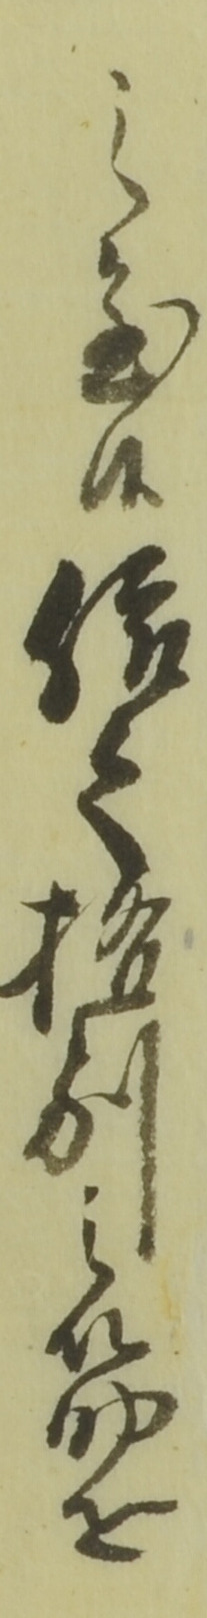之至候依之格別之筋を
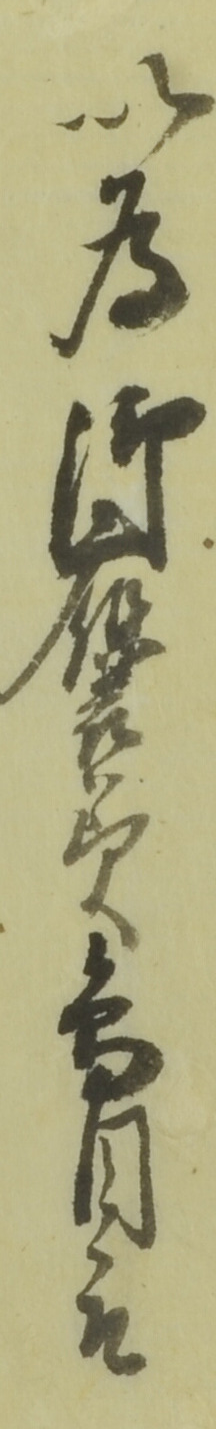以為御褒美鳥目被
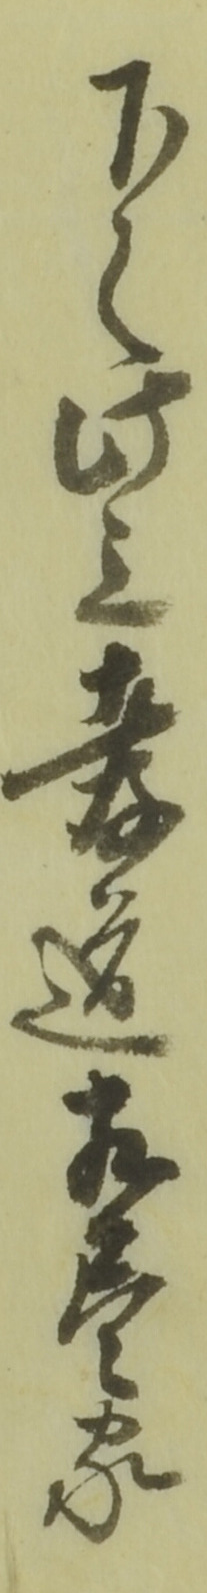下之此上孝道相尽家
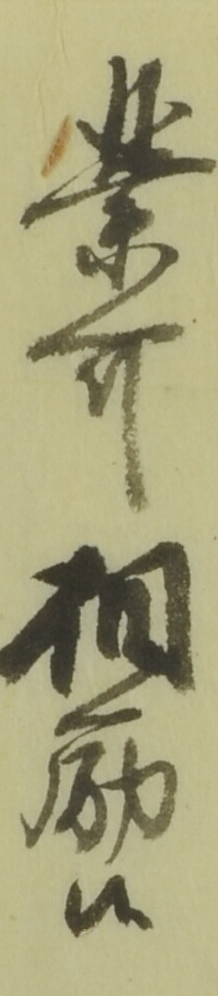業可相励候
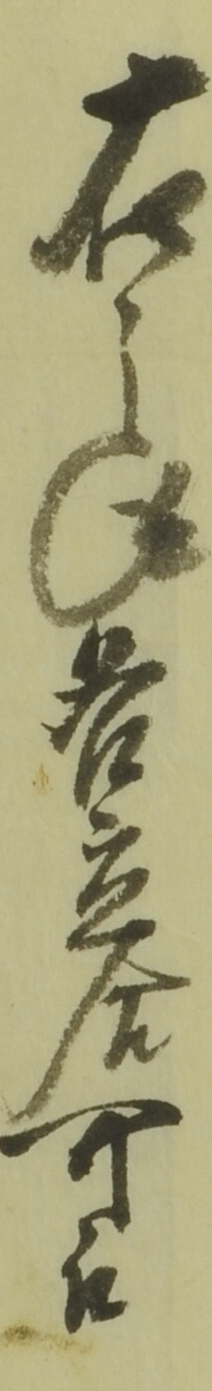右之趣各立合可被
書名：御触書御書附控
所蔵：伊那市立高遠町図書館・合同会社AMANE
